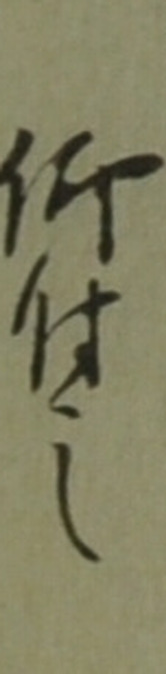仰付之
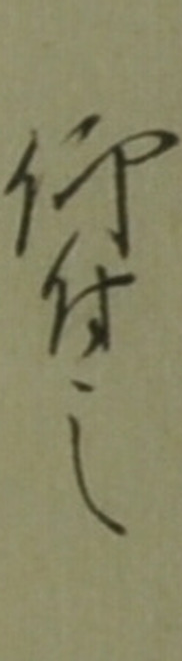仰付之
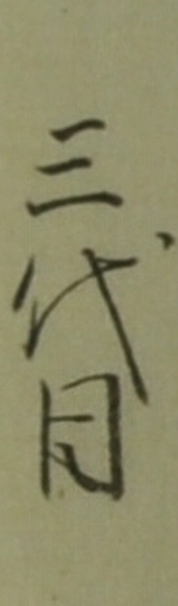三代目

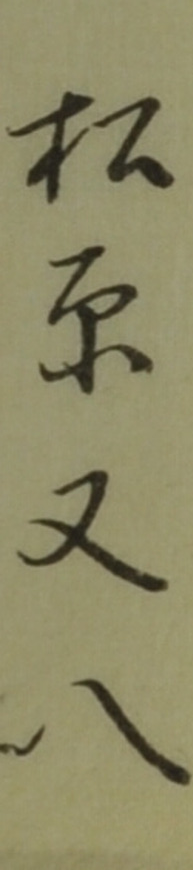松原又八
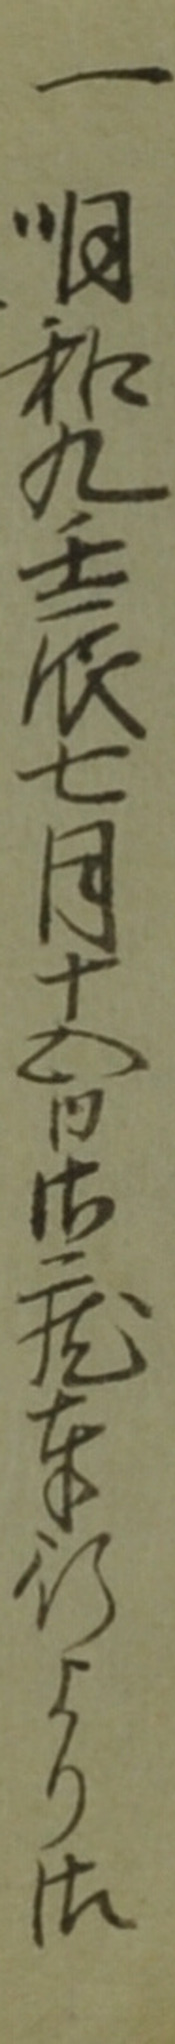一明和九壬辰七月十五日御蔵奉行より御
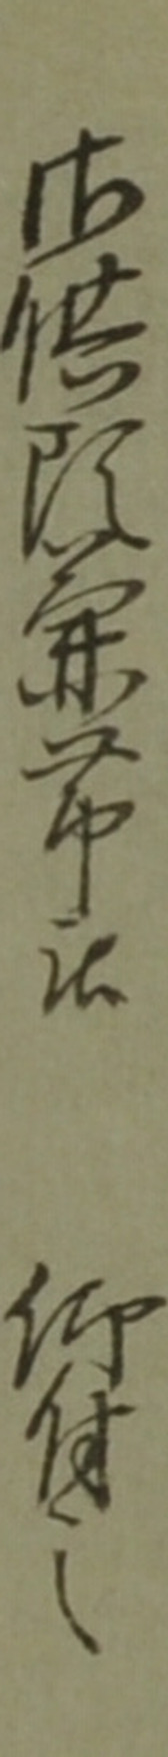御供頭兼帯被仰付之
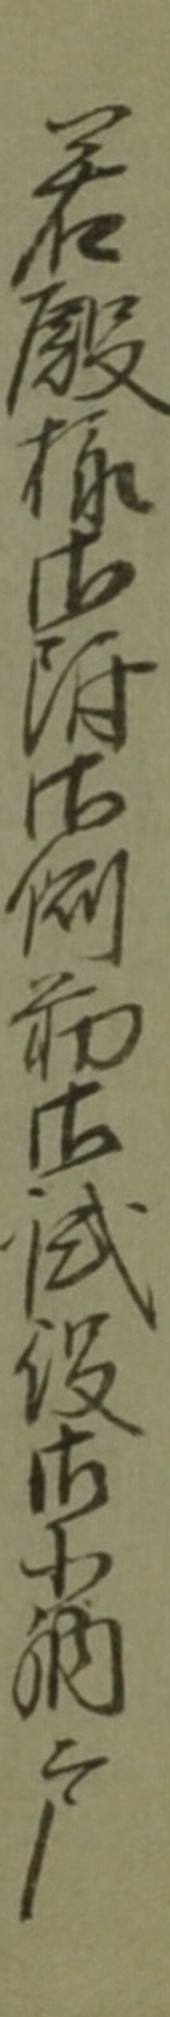若殿様御附御側勤御試役御小納戸
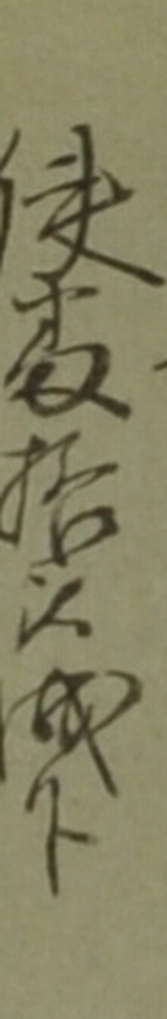使番格被成下
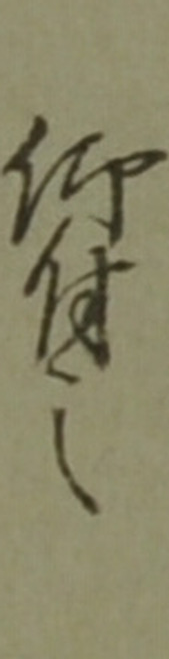仰付之
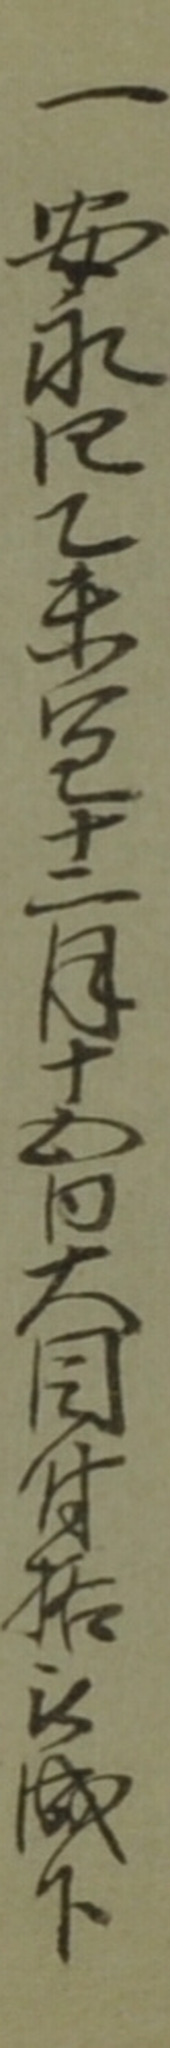一安永四乙未閏十二月十五日大目付格被成下
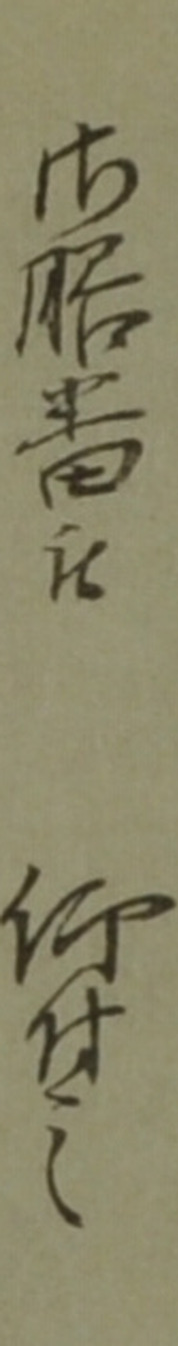御膳番被仰付之
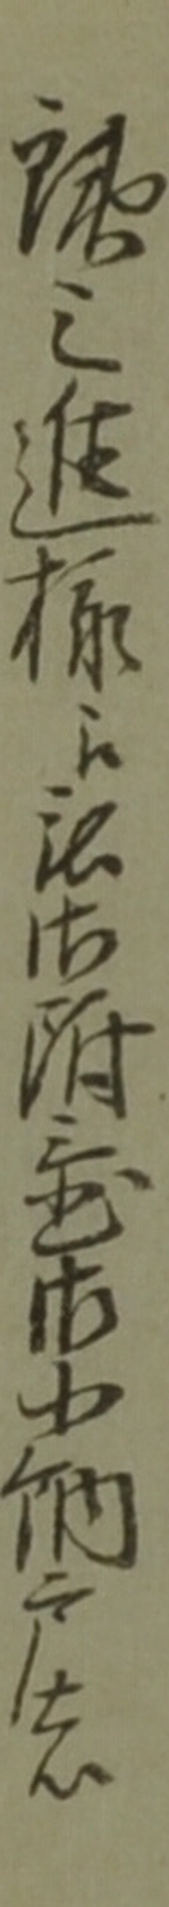鉄之進様江被御附置御小納戸者
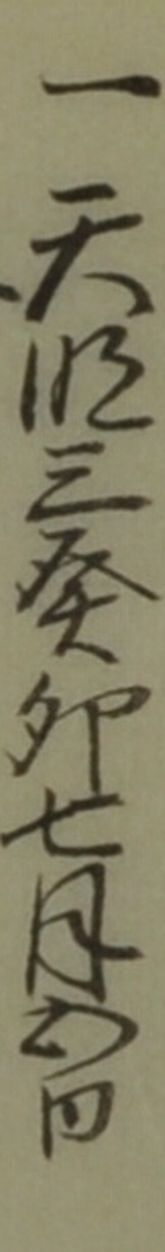一天明三癸卯七月五日
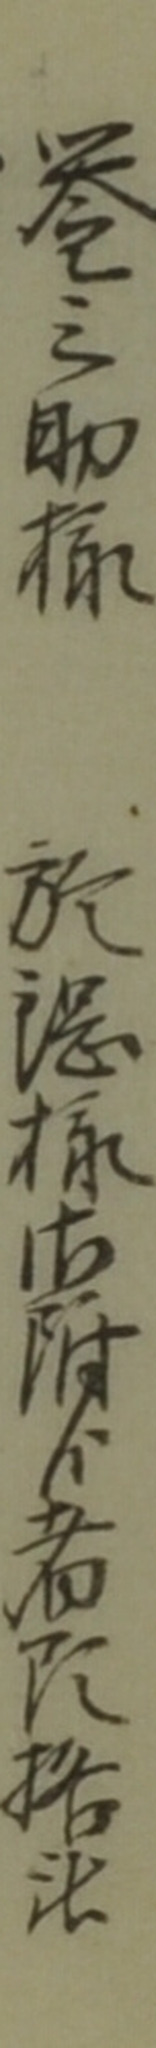釜之助様於綱様御附ゟ者頭格被
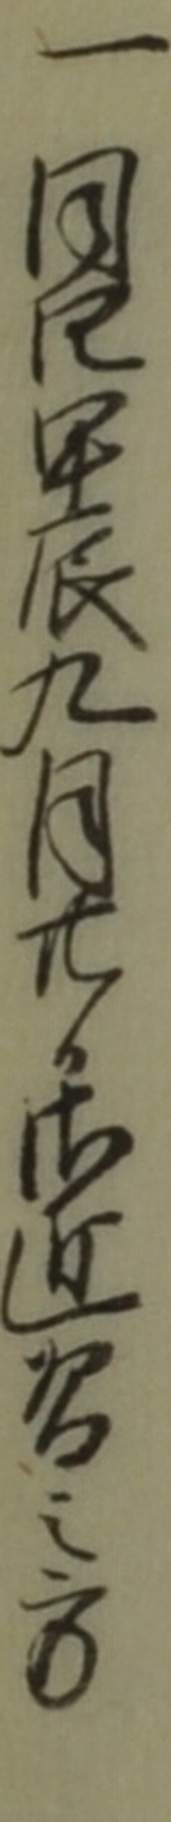一同四甲辰九月廿日御近習之方
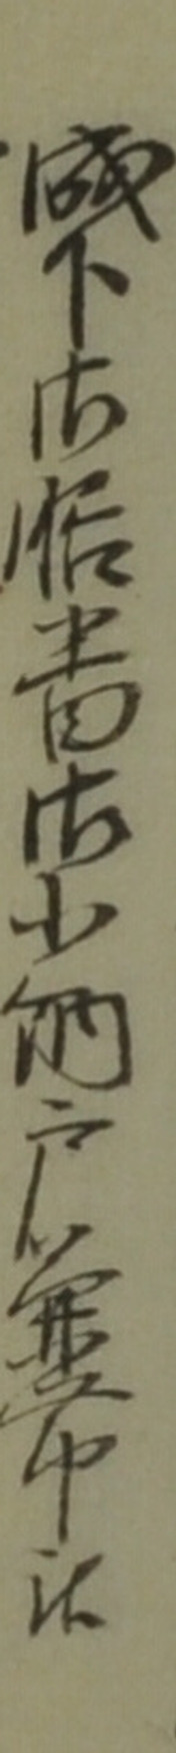成下御膳番御小納戸兼帯被
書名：諸御役代々録（四）
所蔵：伊那市立高遠町図書館・合同会社AMANE
